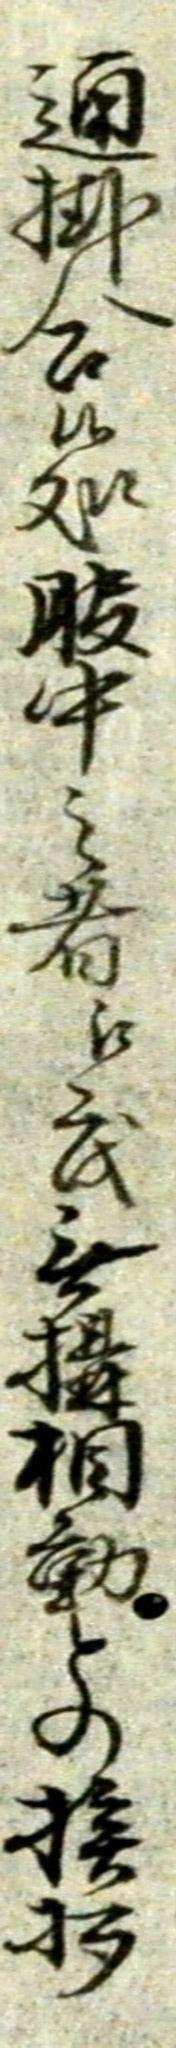通掛合候処服中之者江も無構相勤との挨拶
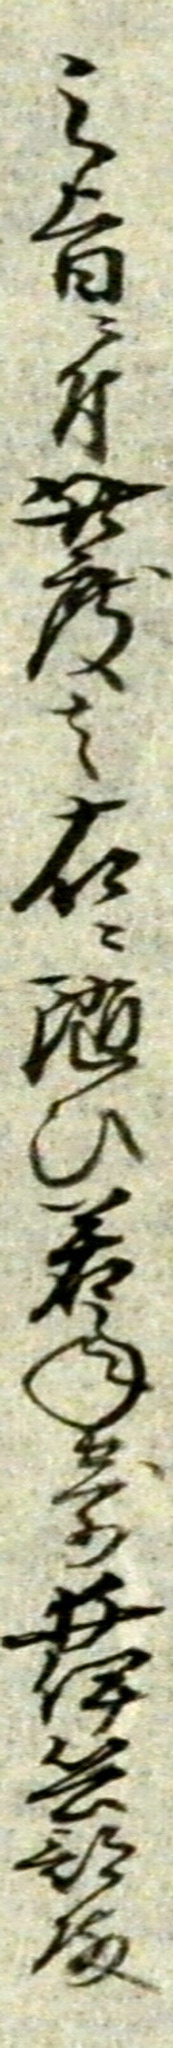之旨ニ付此度者右ニ随ひ若年寄井伊兵部殿
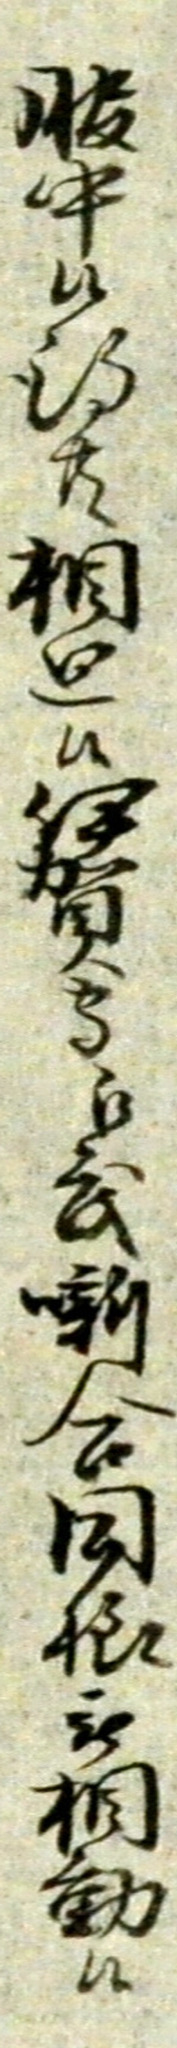服中候得共相廻候伊賀守江も噺合同様被相勤候
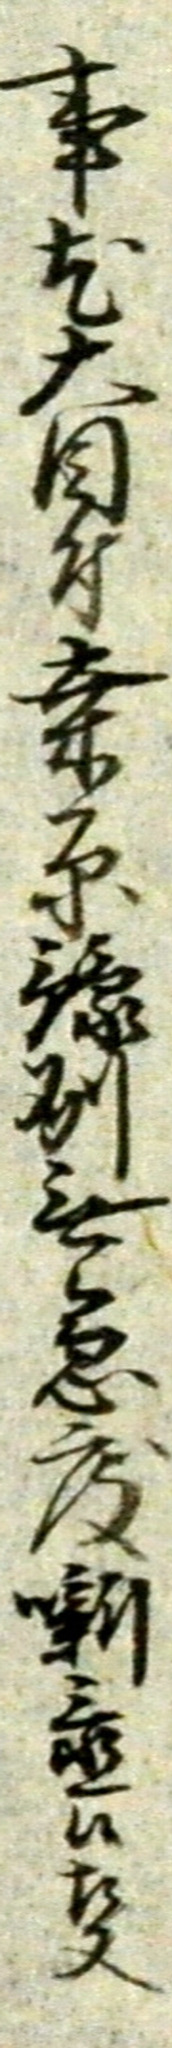事尤大目付桑原予州無急度噺置候叓
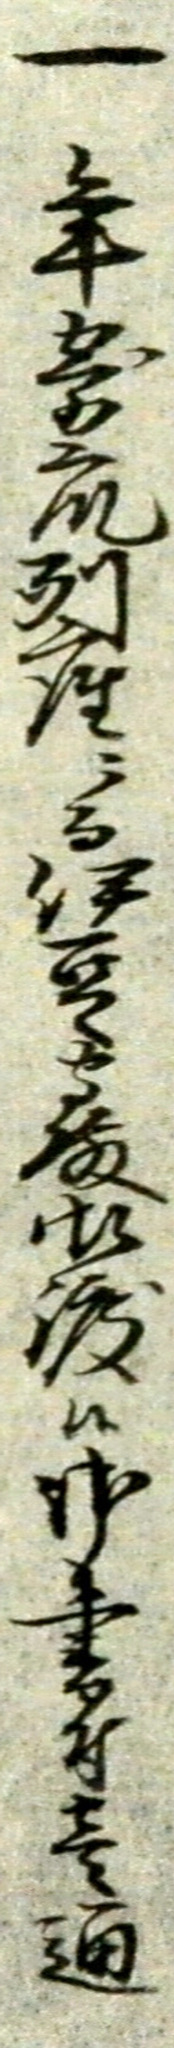一年寄衆列座ニ而伊豆守殿御渡候御書付壱通
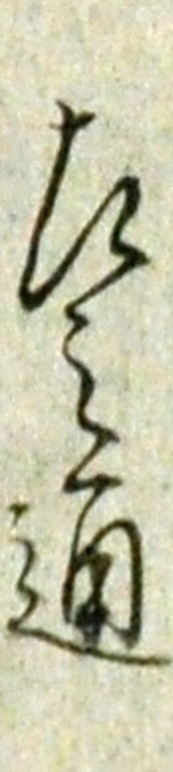左之通

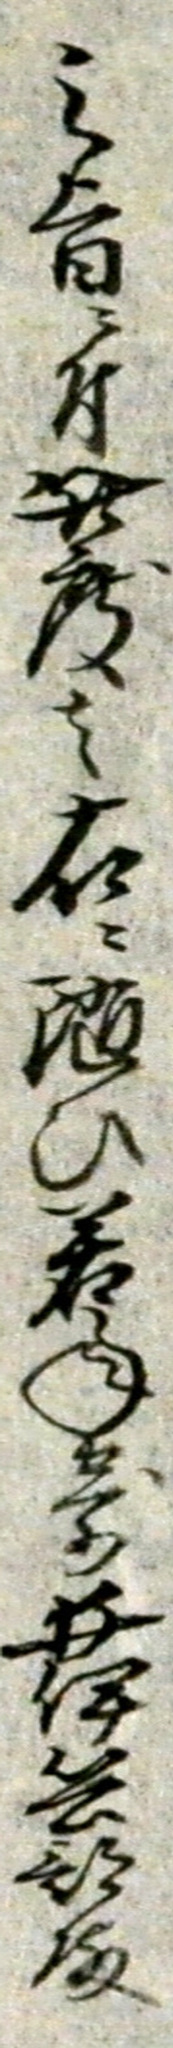之旨ニ付此度者右ニ随ひ若年寄井伊兵部殿
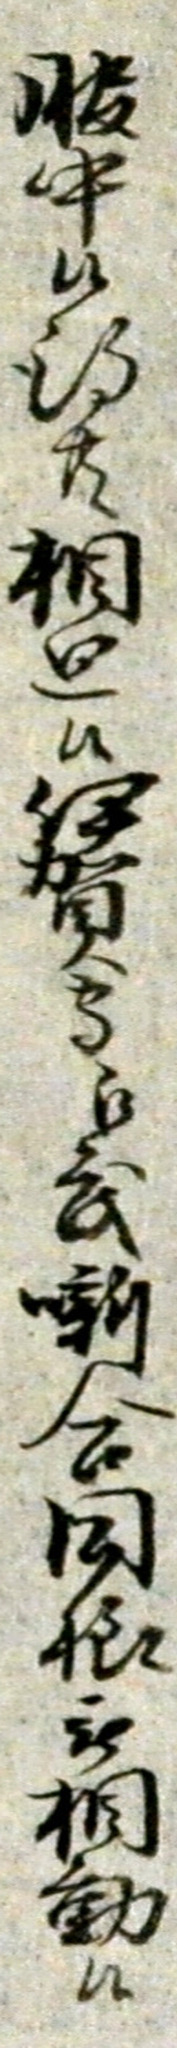服中候得共相廻候伊賀守江茂噺合同様被相勤候
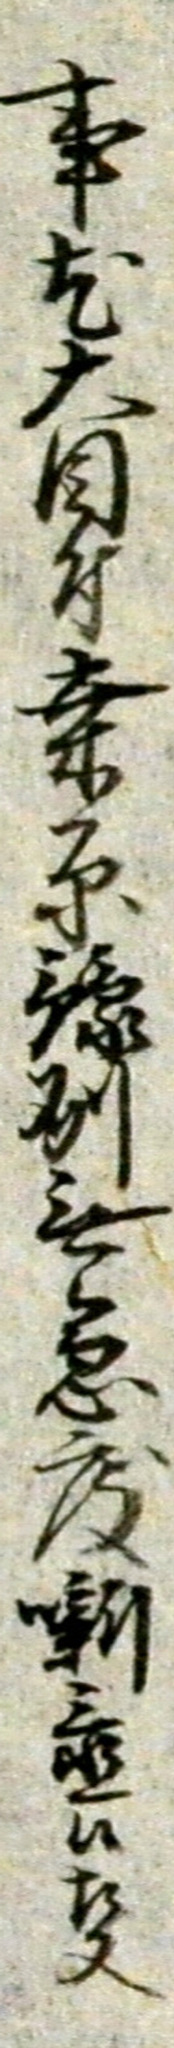事尤大目付桑原豫洲無急度噺置候叓
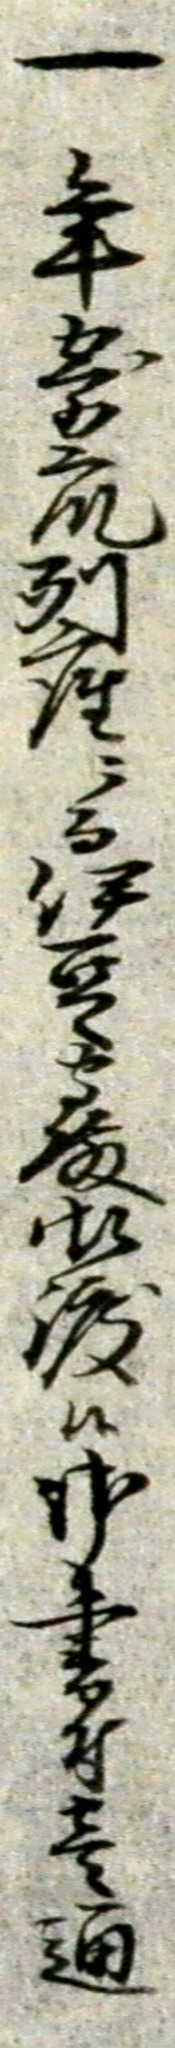一年寄衆列座ニ而伊豆守殿御渡候御書付一通
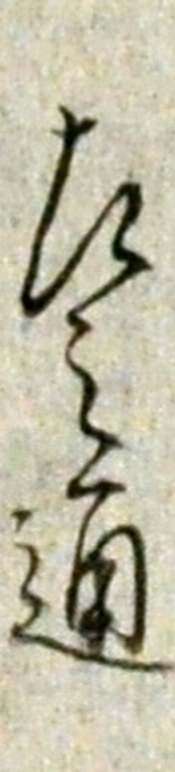左之通
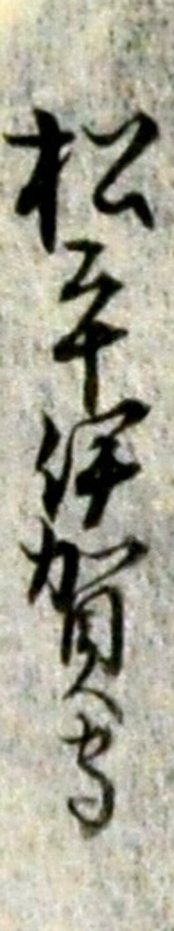松平伊賀守
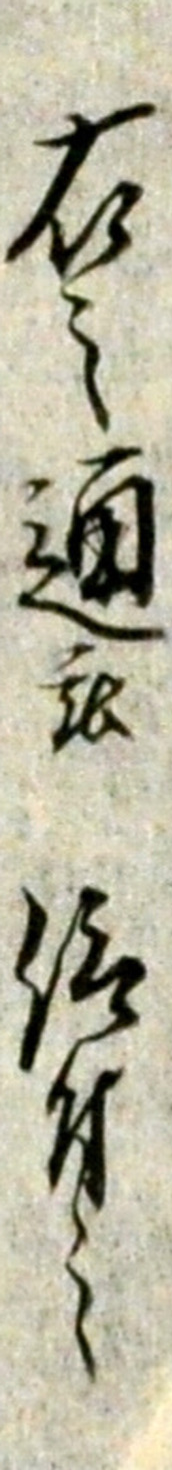右之通被仰付之
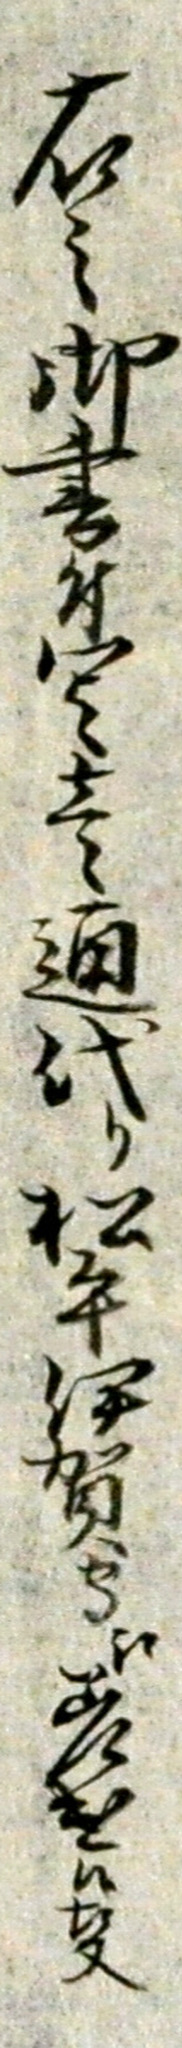右之御書付写壱通代り松平伊賀守江差遣候叓
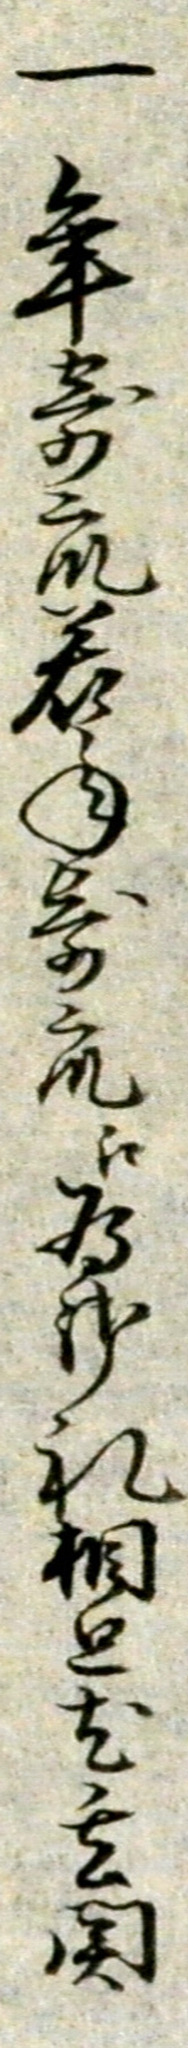一年寄衆若年寄衆江為御礼相廻尤玄関
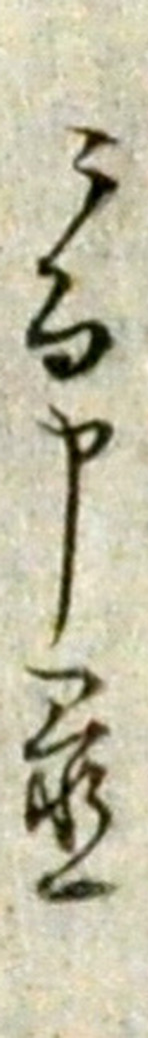ニ而申置
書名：日光御名代相勤候節ノ留
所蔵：伊那市立高遠町図書館・合同会社AMANE
